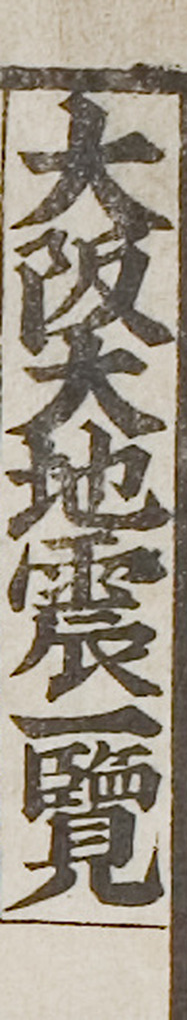大阪大地震一覧
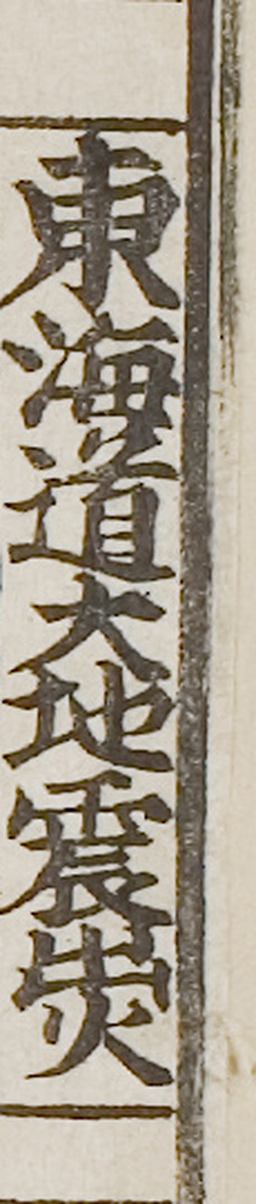東海道大地震出火
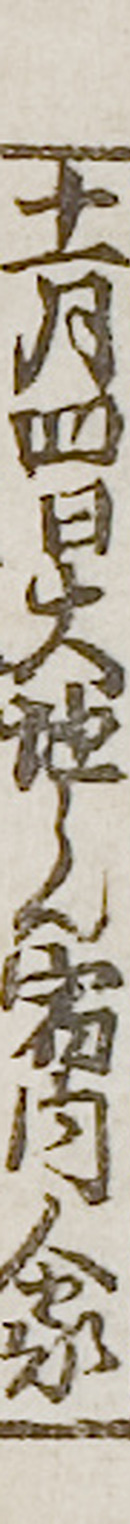十一月四日大地しん宿内人家
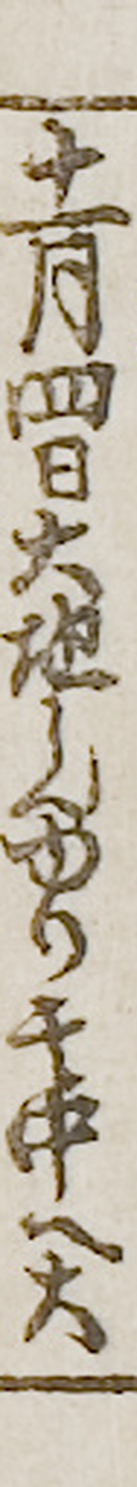十一月四日大地しんゆり其中へ大
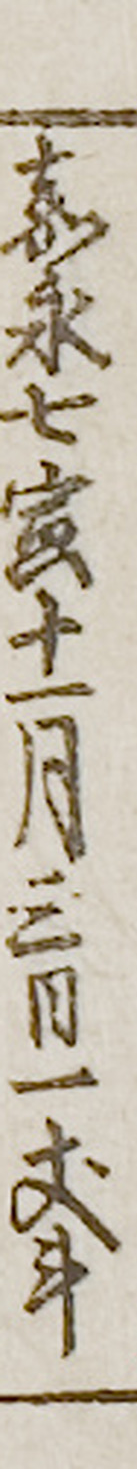嘉永七寅十一月三日一丈斗
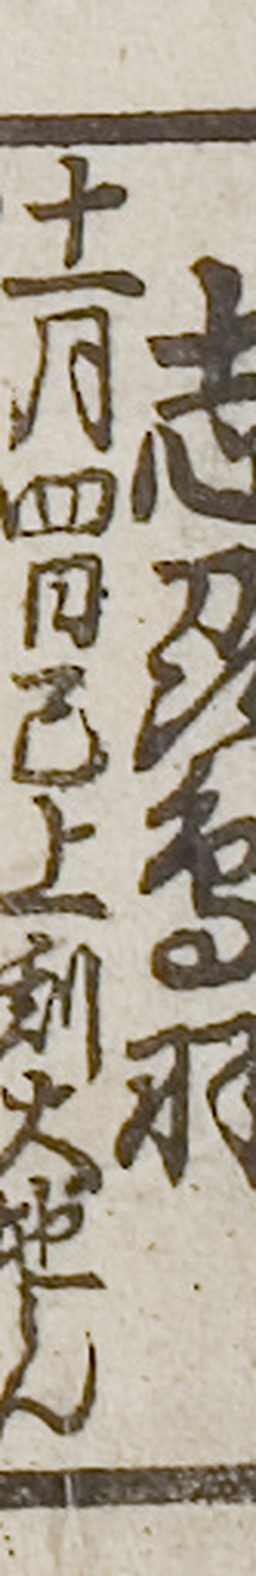十一月四日巳上刻大地しん
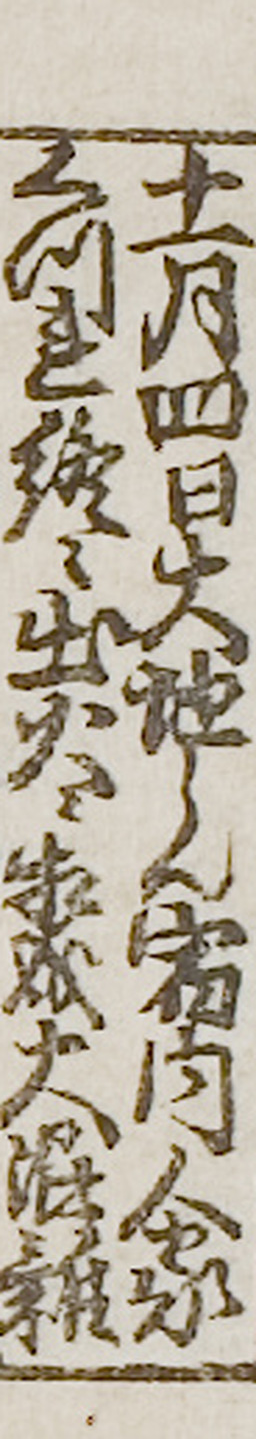くつれ終に出火に相成大混雑
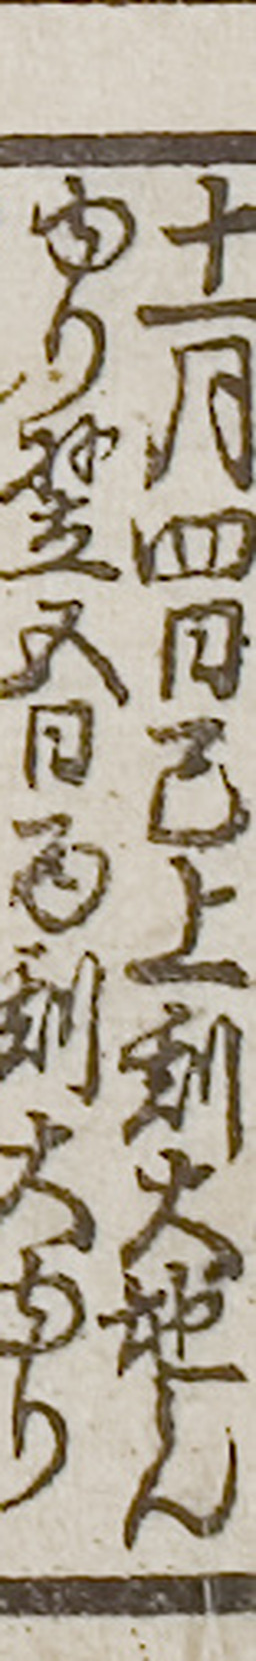ゆり翌五日酉刻大ゆり
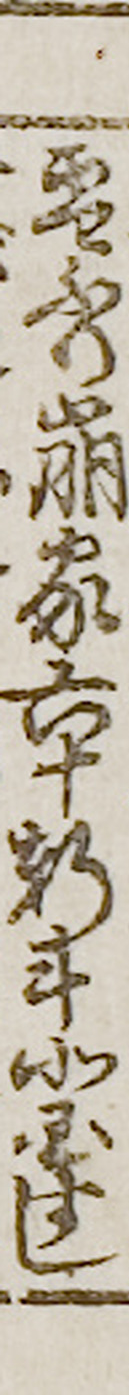雪ふり崩家六十軒斗北国すし
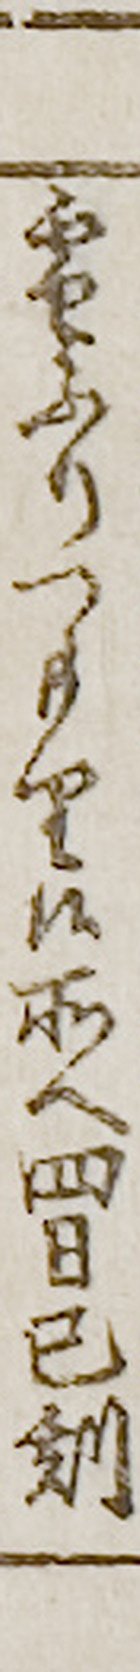雪ふりつもり候所へ四日巳刻
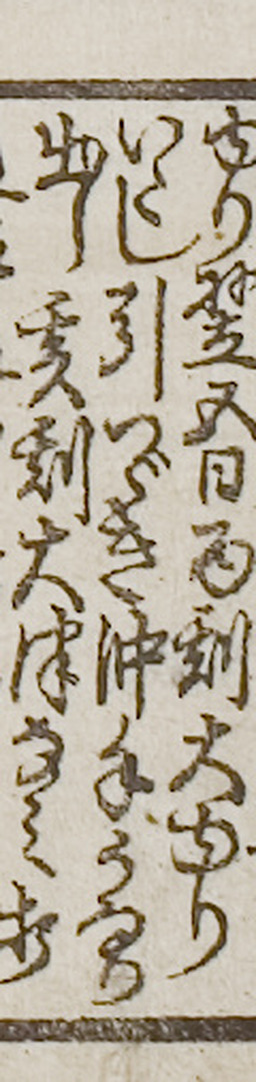いたし引つゞき沖手うなり
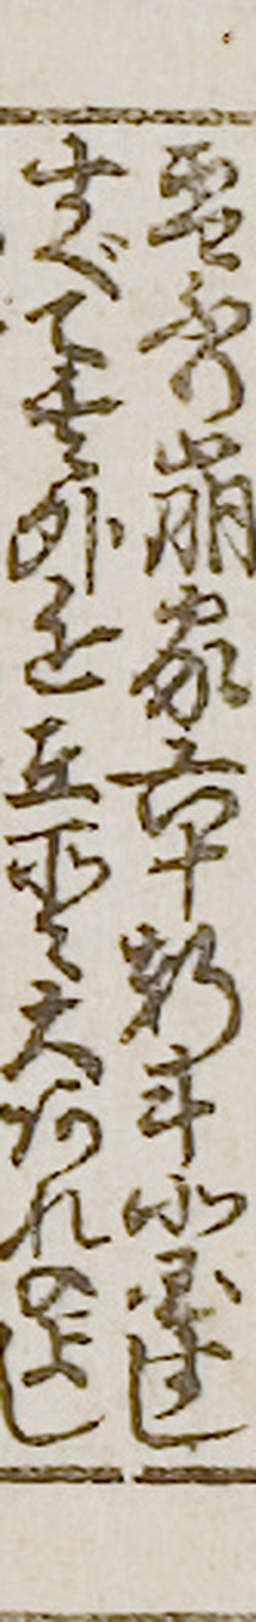すべて其外近在所々大あれのよし
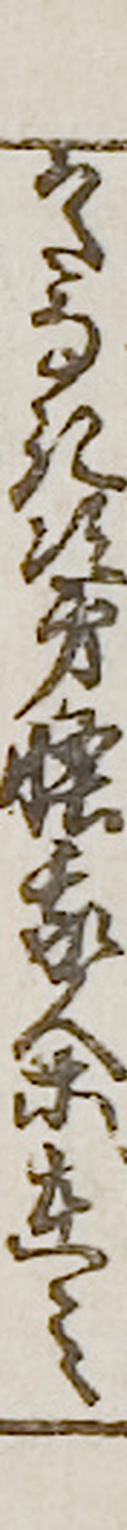かたなき次第怪我人等在之
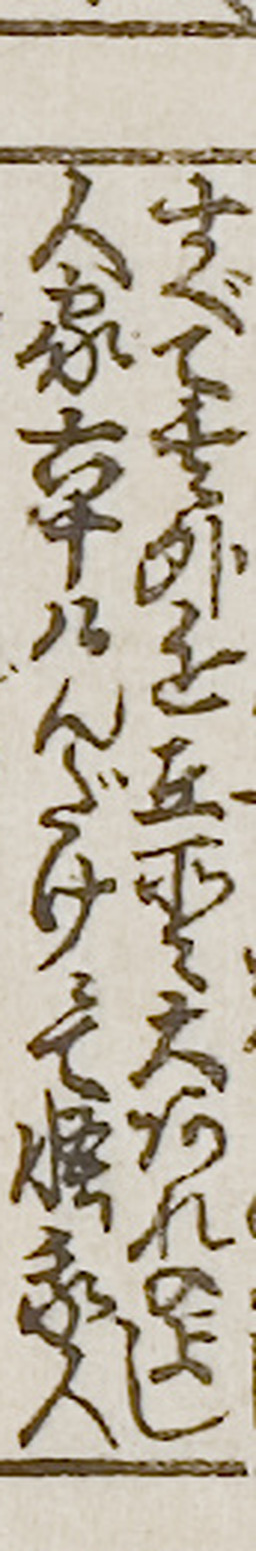人家六十けんだけにて怪我人
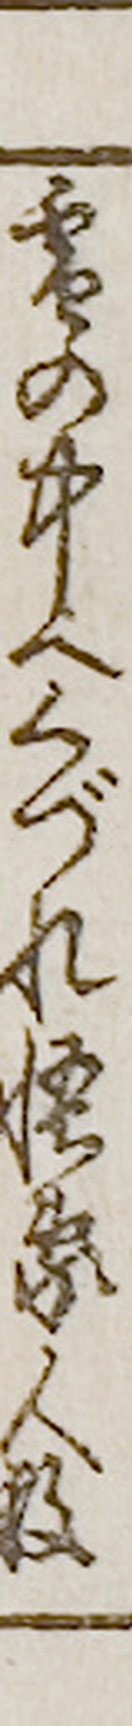雪の中へくづれ怪我人数
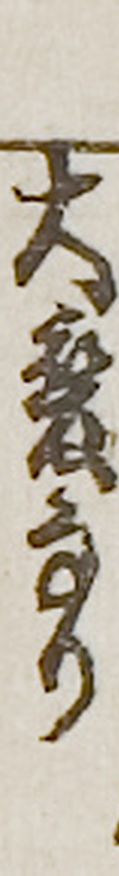大変なり
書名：大阪大地震一覧
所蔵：東京大学総合図書館 General Library in the University of Tokyo, JAPAN
